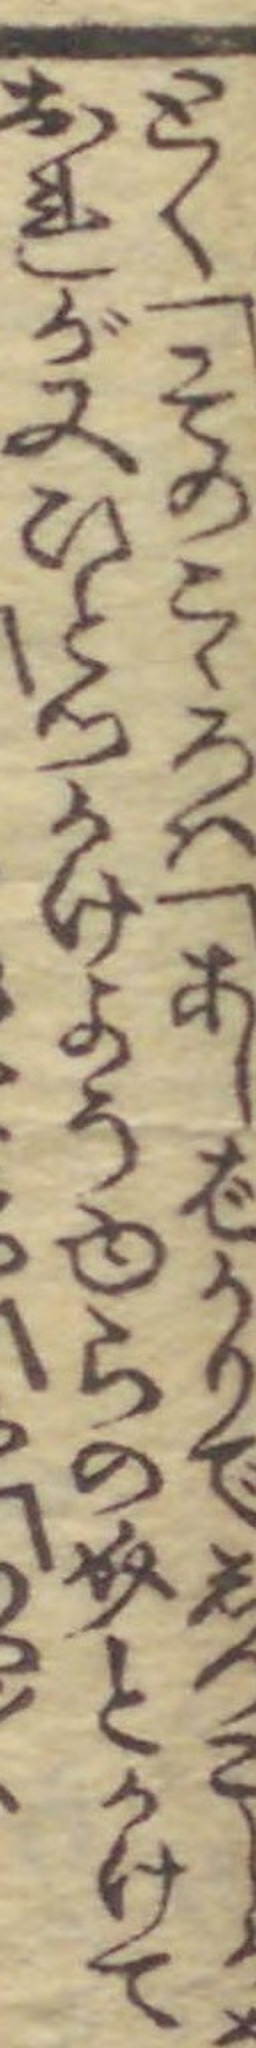おれが又ひとつかけようゆらの介とかけて
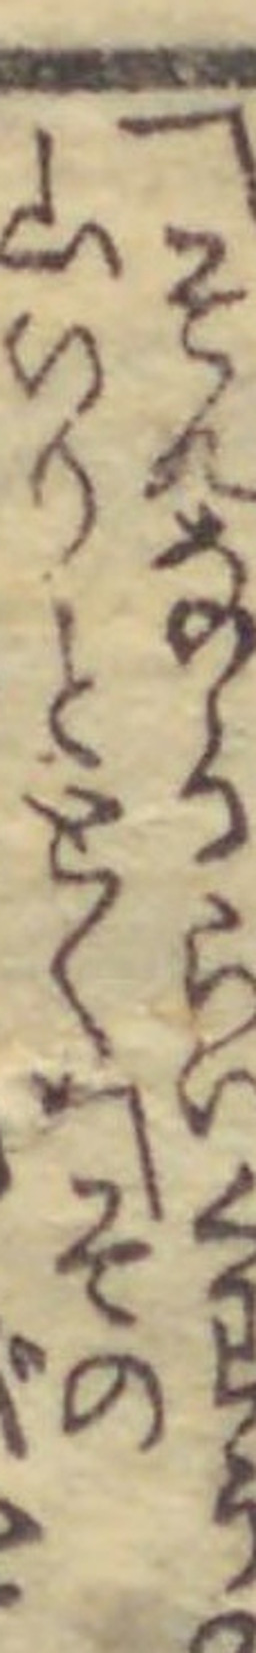山いりととく〽その
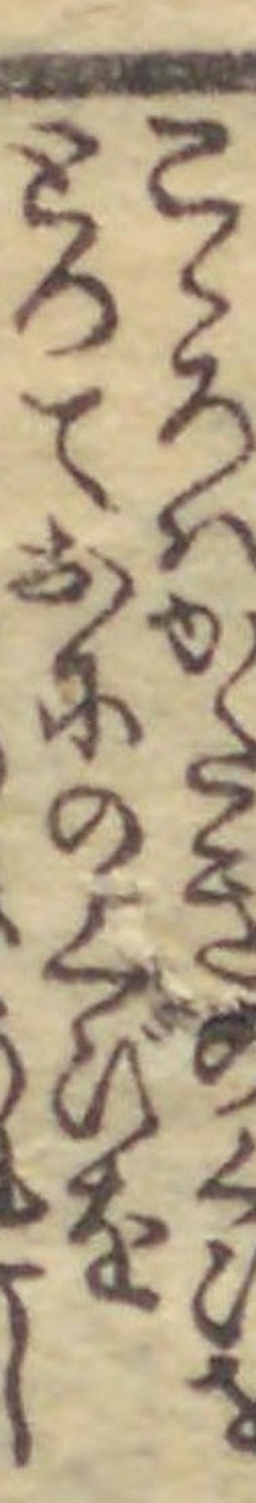とつておにのくびを
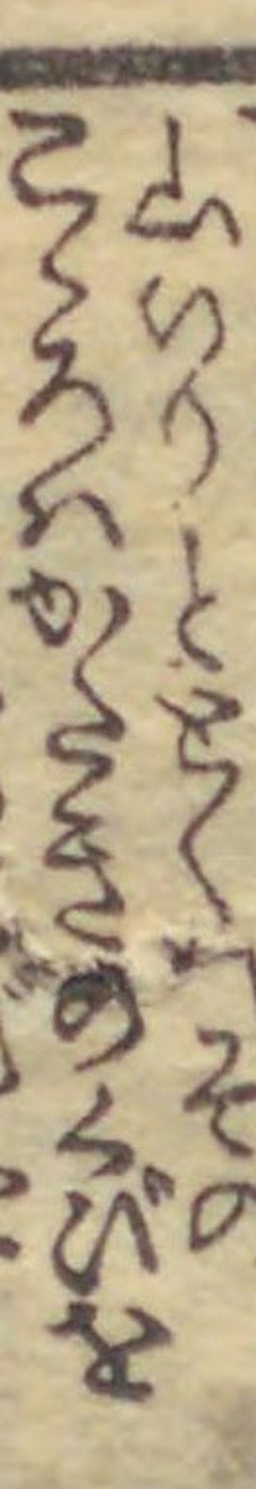こゝろはかたきのくびを
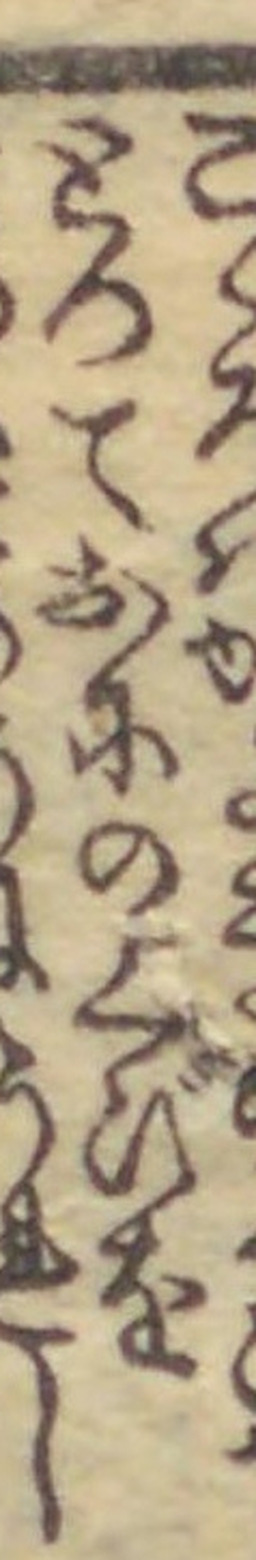とつておにのくびを
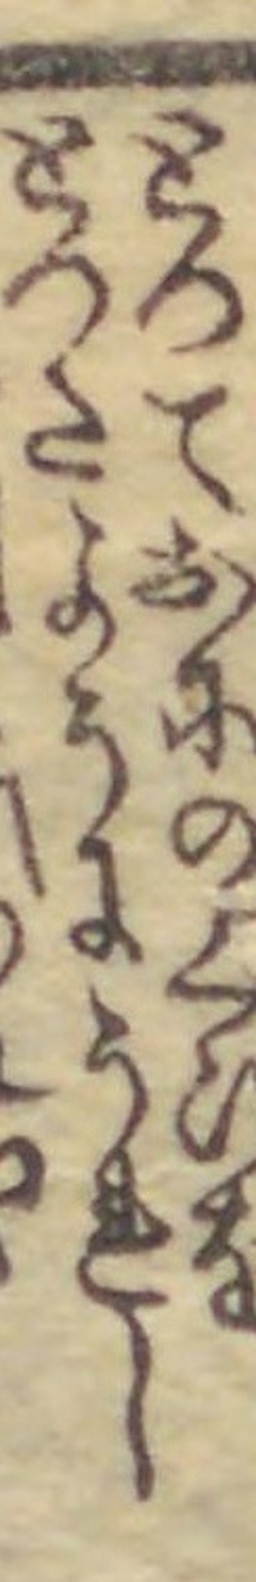とつたようなうれし
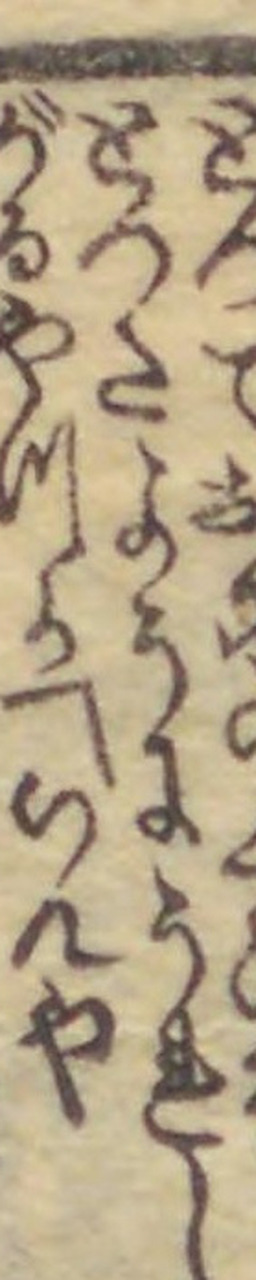がるやつか〽いんや
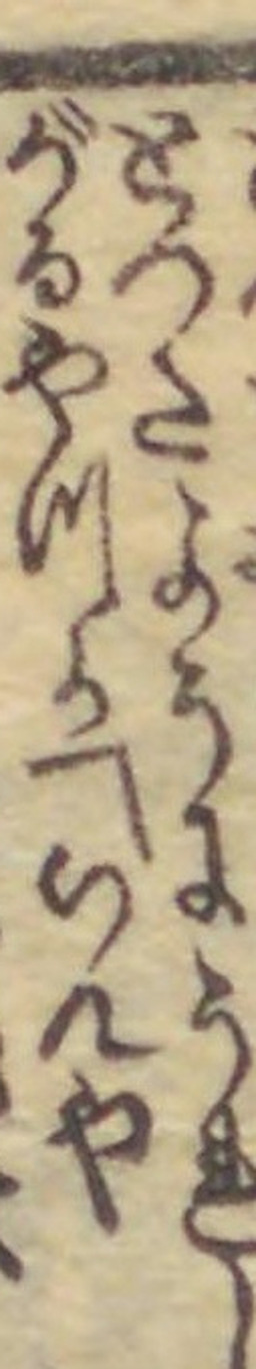がるやつか〽いんや
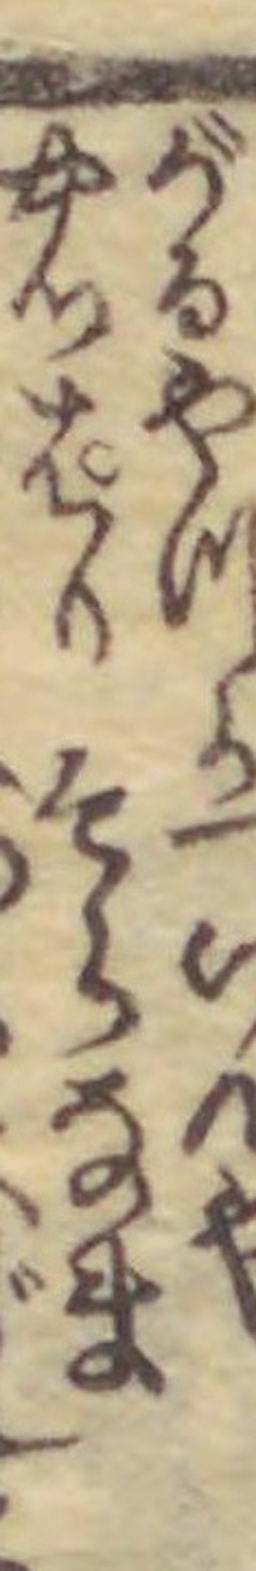やつぱりそらなま
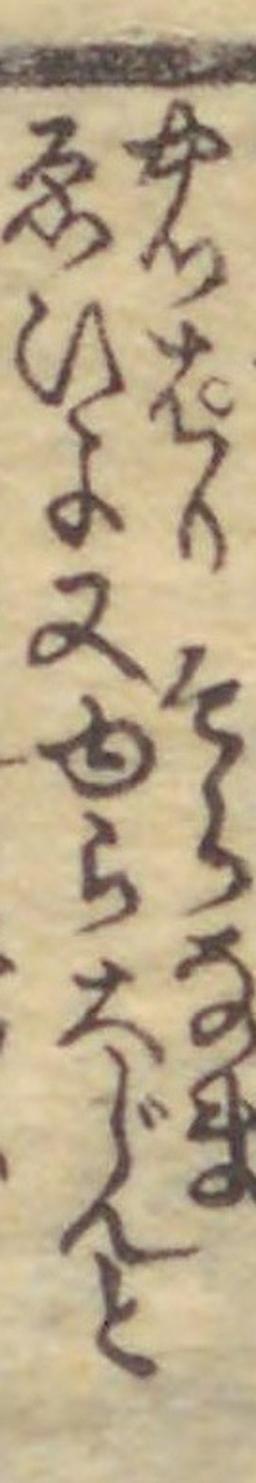ゑひよ又ゆら大じんと
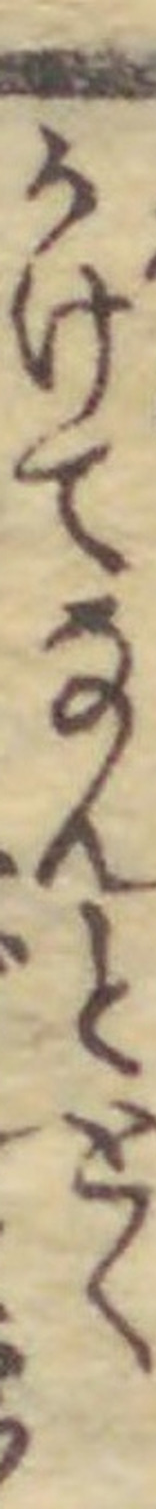かけてなんととく
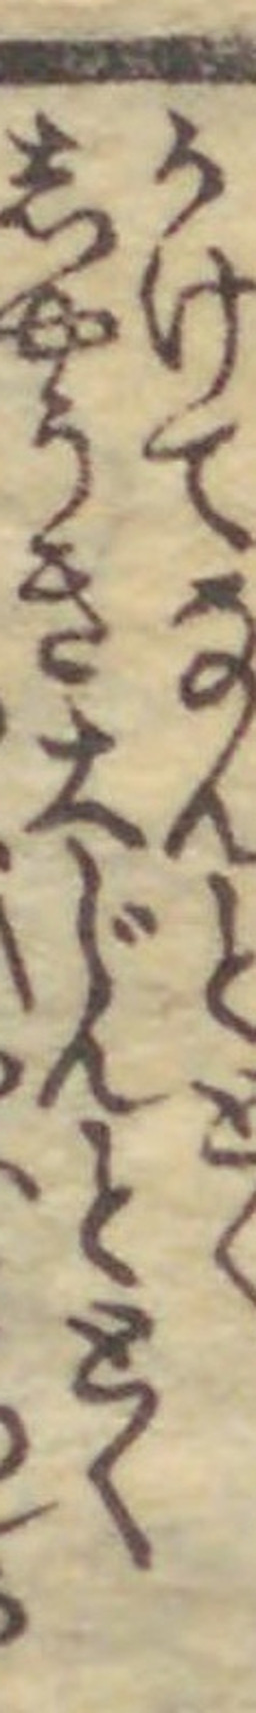しやうき大じんととく
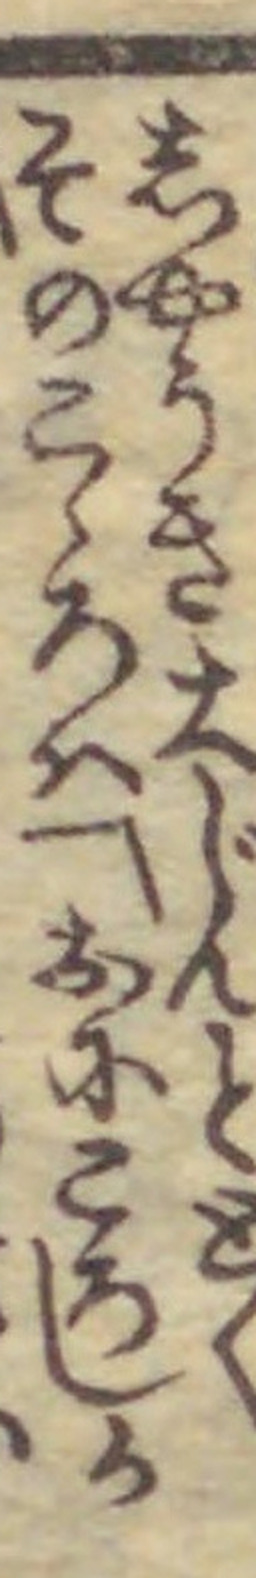そのこゝろは〽おにころしか
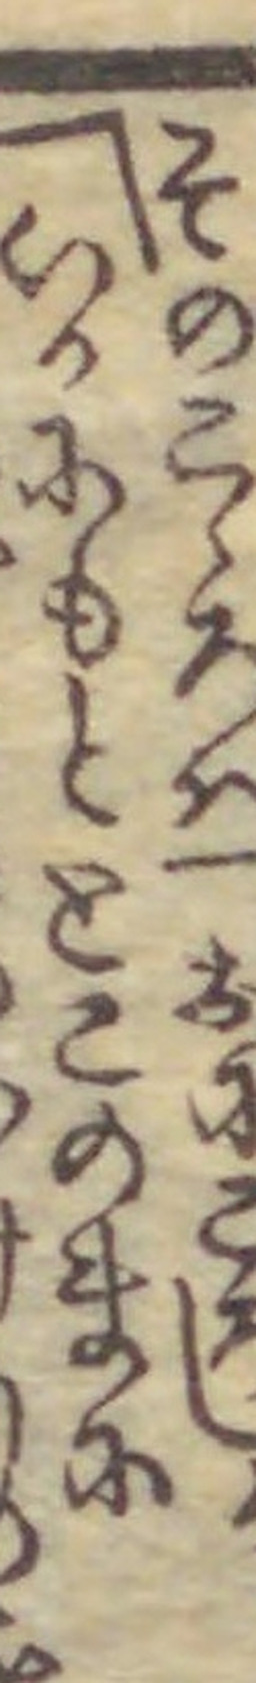〽いかにもととこのまに
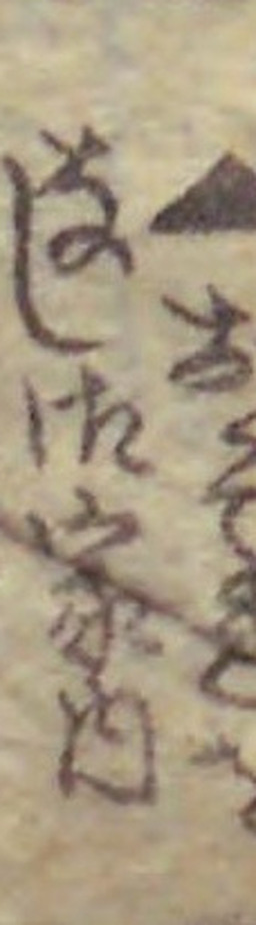なし御家内
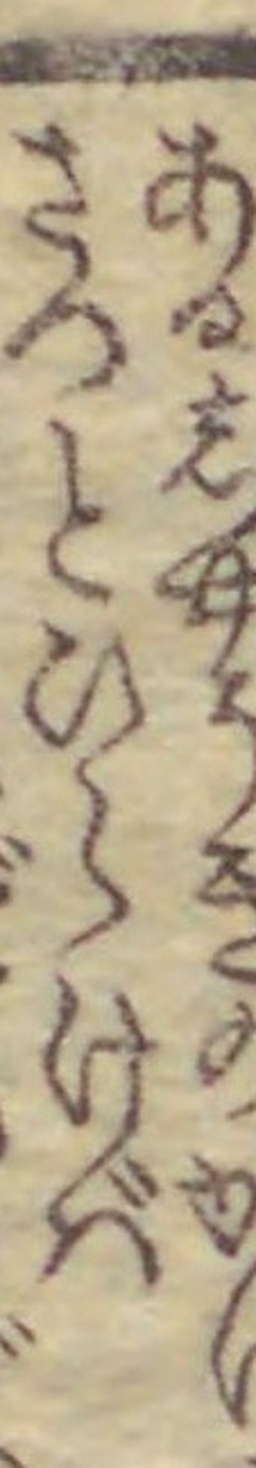さつとひらけば
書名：大時代唐土化物 3巻. 曽我太夫染
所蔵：国立国会図書館 National Diet Library, JAPAN
